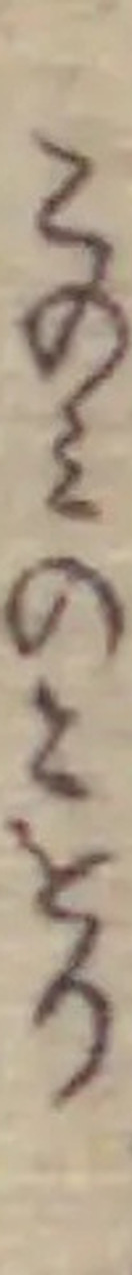このみのとをり
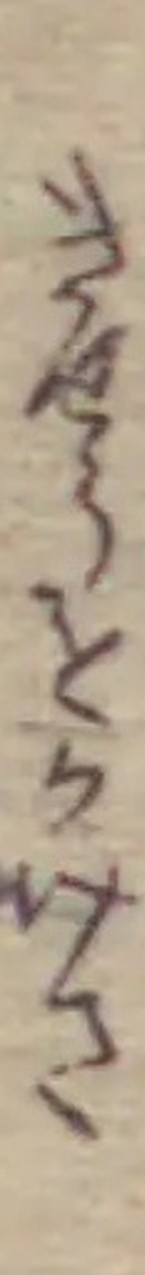きせうをかけた

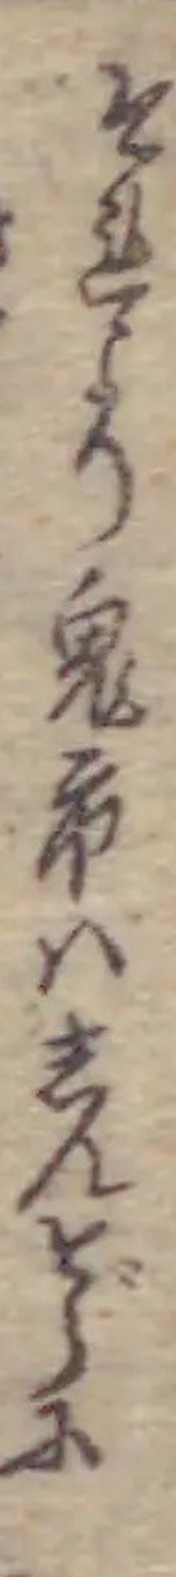それより鬼市はしんぞうに
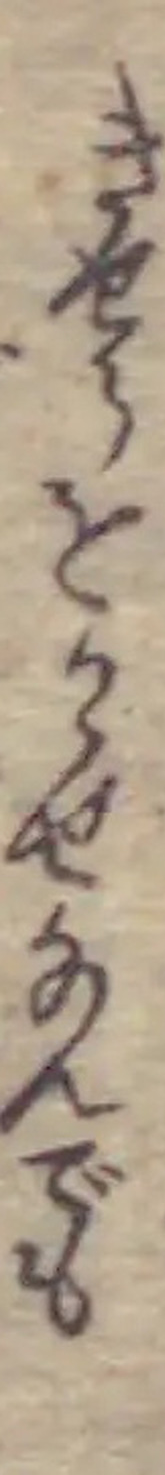起請をかゝせなんでも
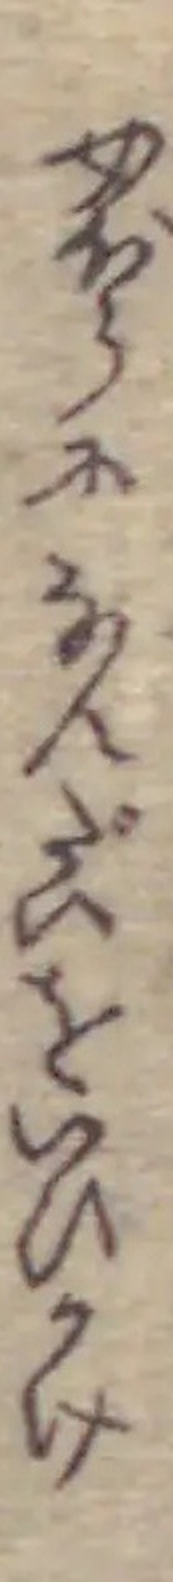女ぼうになんだいをいひかけ
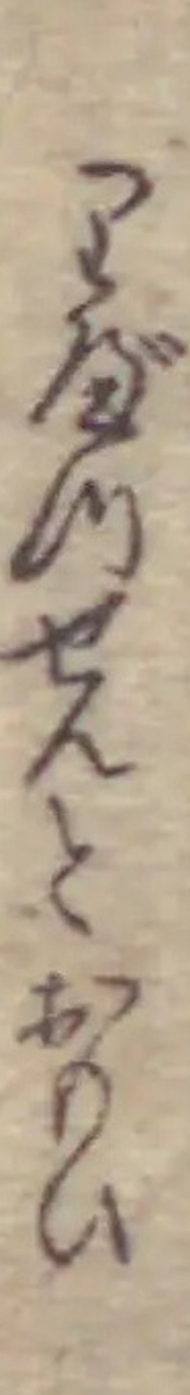りべつせんとおもひ
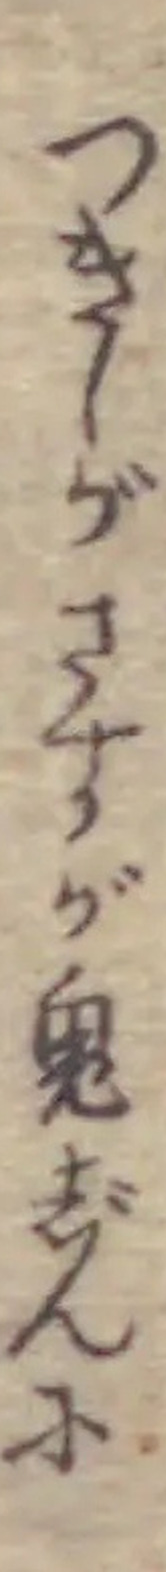つきしがさすが鬼じんに
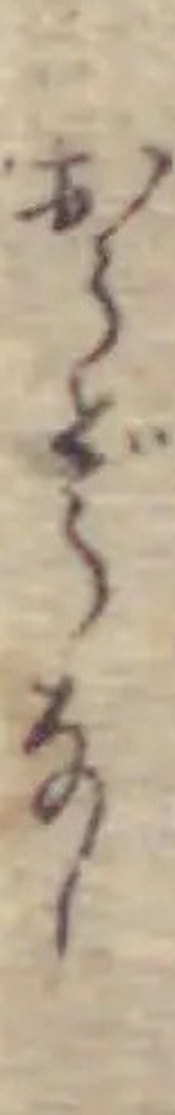おうどうなし
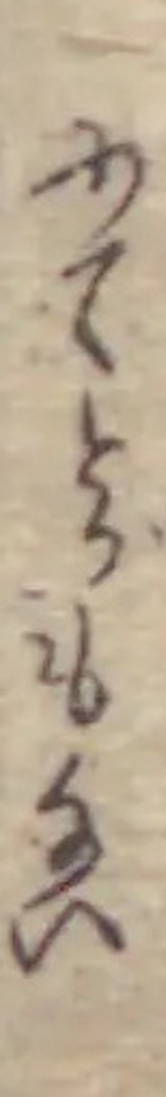にてとがもない
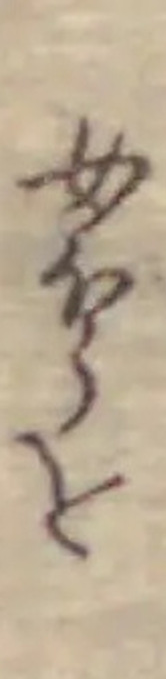女ほうを
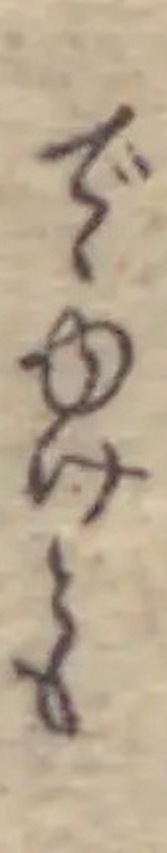でゝゆけとも
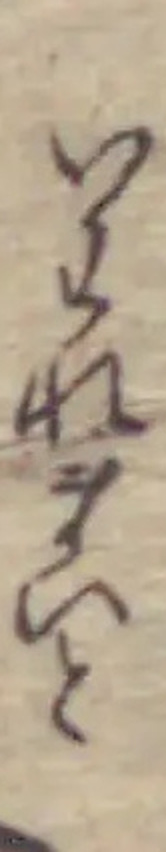いわれまいと
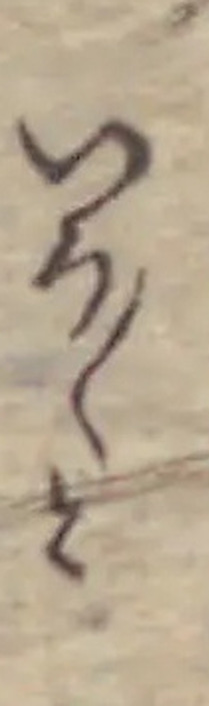いら〳〵と
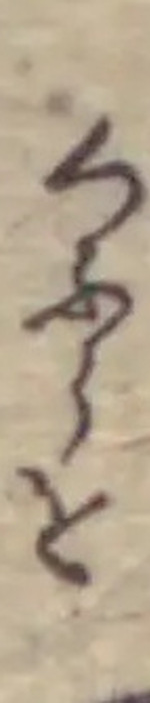くふうを
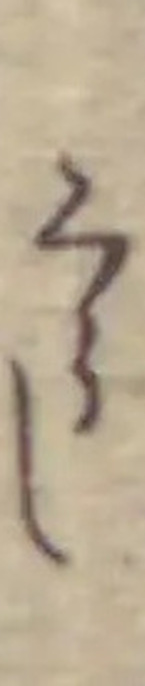くらし
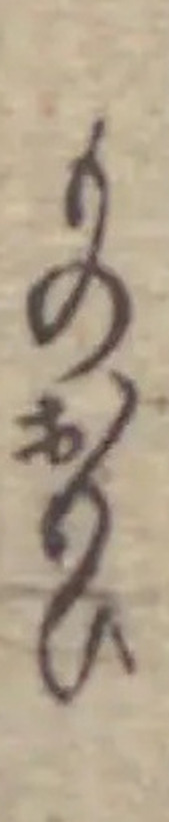ものおもひ
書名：鬼子宝 3巻
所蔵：国立国会図書館 National Diet Library, JAPAN
